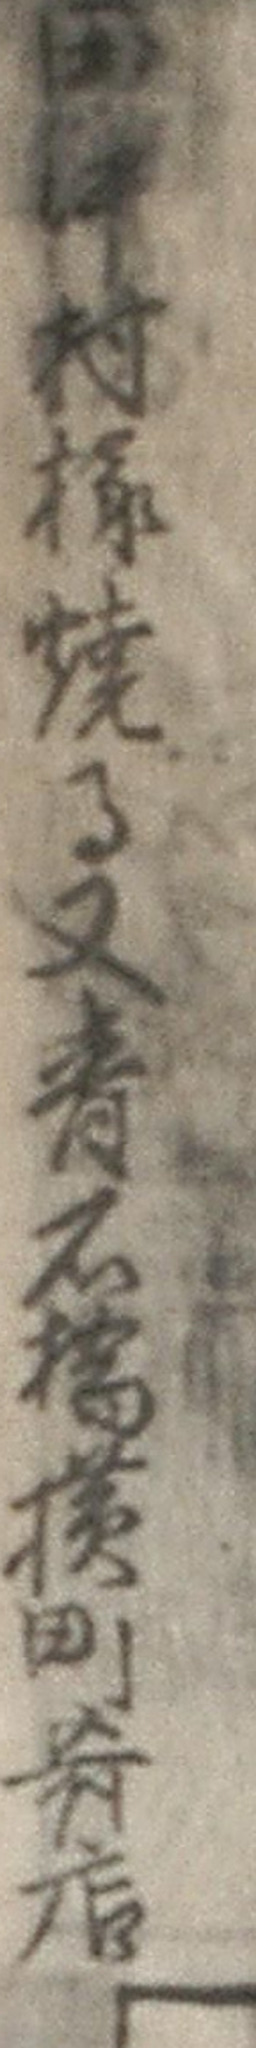田中村様焼る又青石橋横町肴店
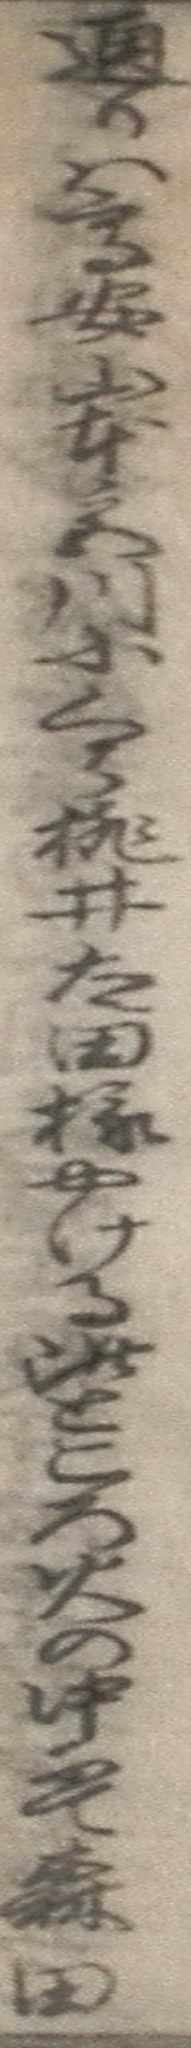通リは高安山本宮川小くら桃井太田やける此ところ火の中にて森田
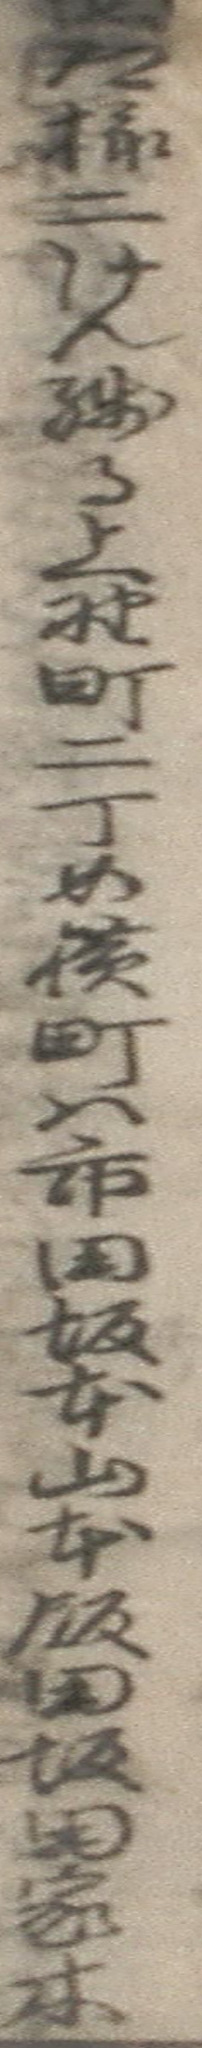西郷様二けん残る上野町二丁め横丁は市田坂本山本飯田坂田家木
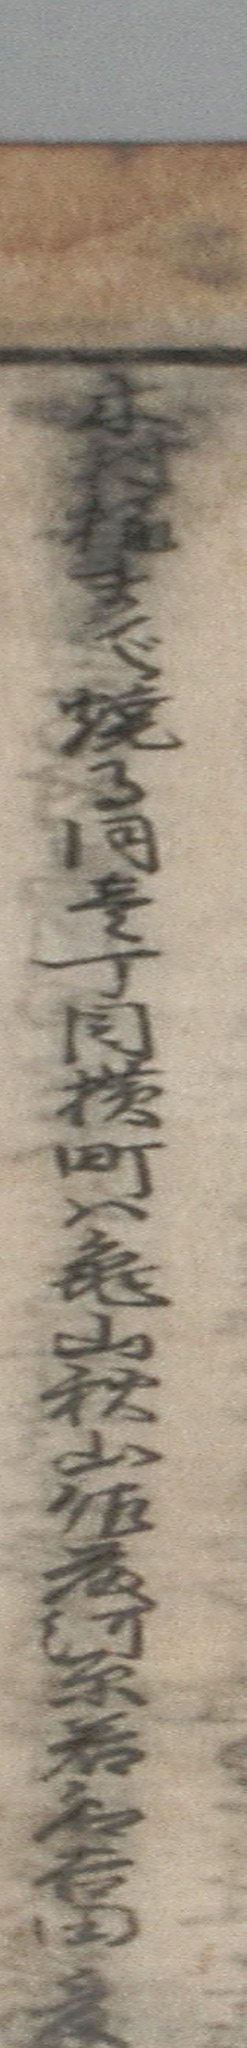木村様まで焼る同壱丁目横丁は亀山秋山佐藤河原若名吉田爰
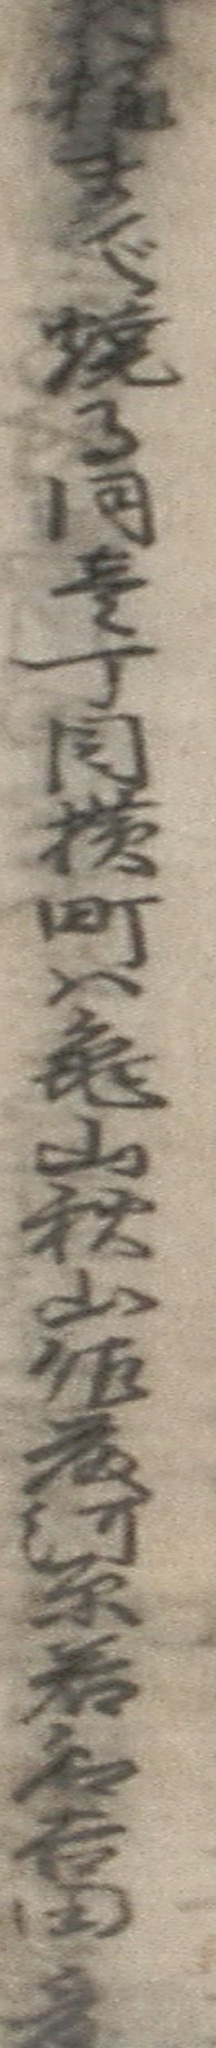木村様まで焼る同壱丁目横丁は亀山秋山佐藤河原若名吉田爰
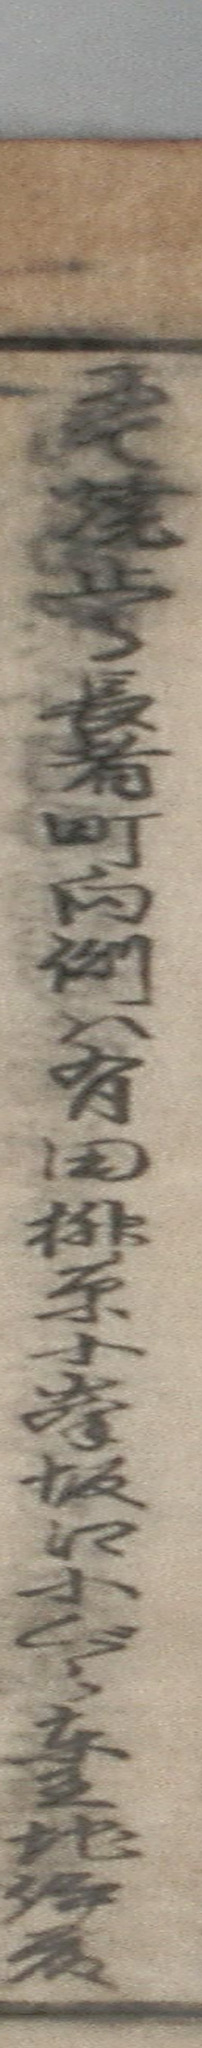にて焼止る長者町向側は有田榊原小峰坂口小ぐら東王地伊藤
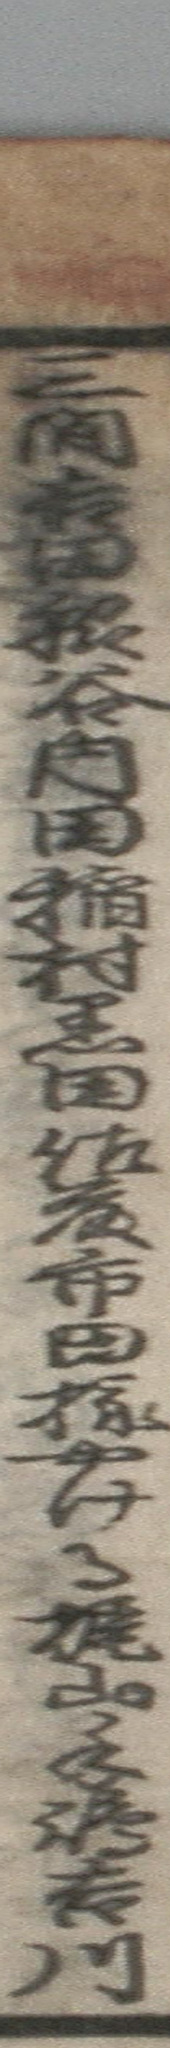三間𠮷田脇谷内田稲村黒田佐藤市田様やける梶山手嶋吉川
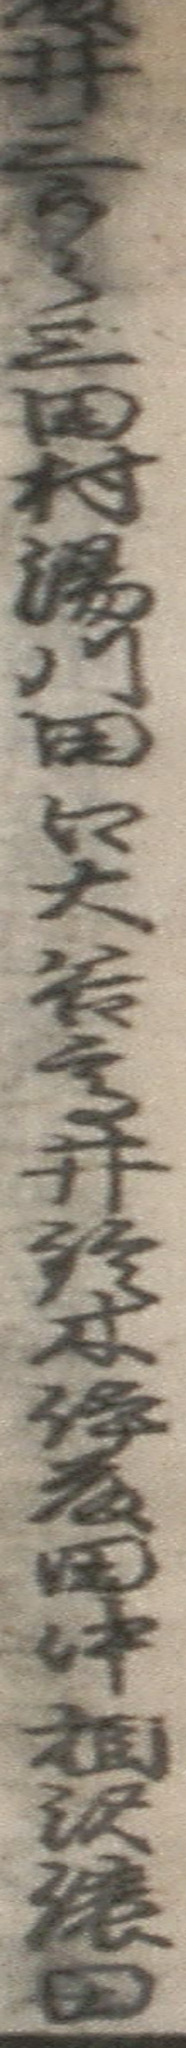藤井三うら三田村湯川田口大谷髙井鈴木伊藤田中相沢俵田
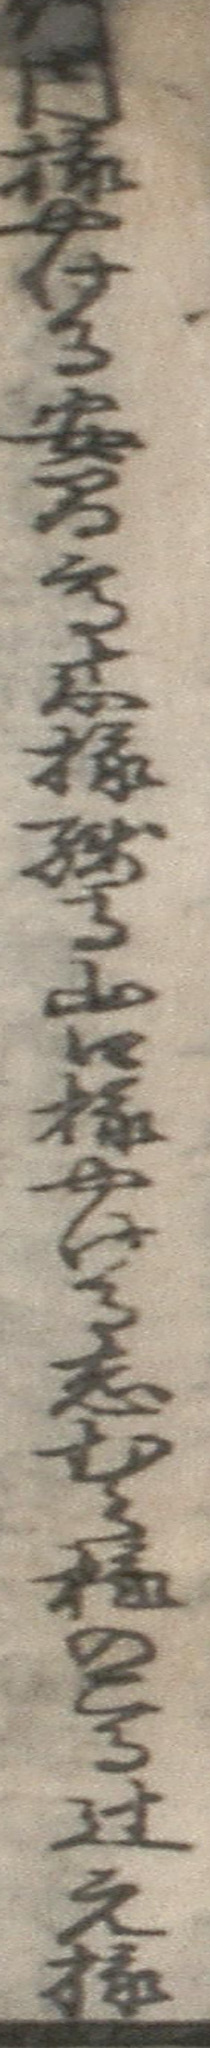竹内様やける安間高木様残る山口様やける志むら様のこる辻元様
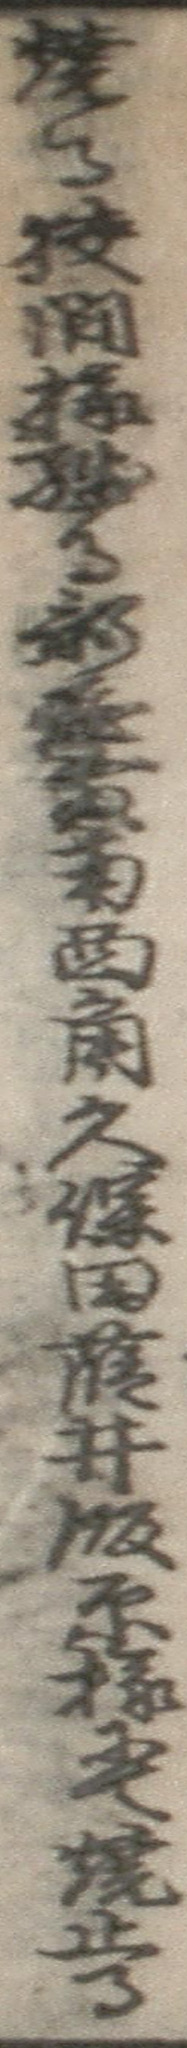焼る狭間様残る新屋敷南西角久保田藤井飯原様にて焼止る
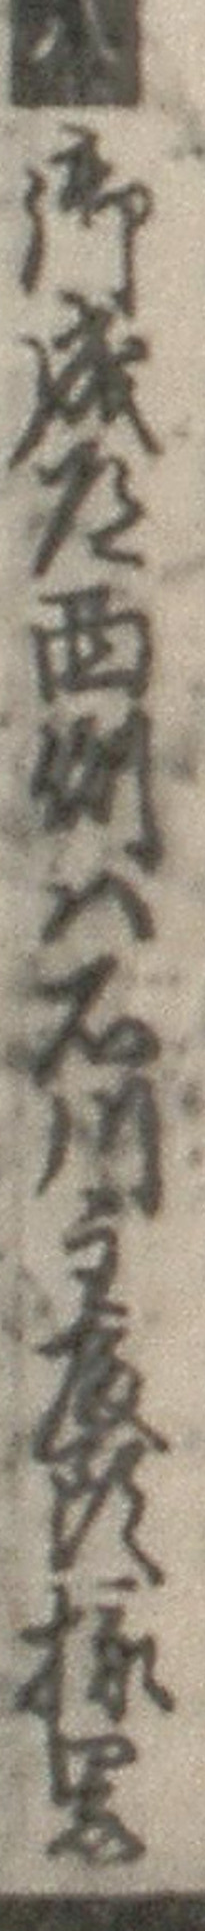八御成道西側は石川主殿頭様黒
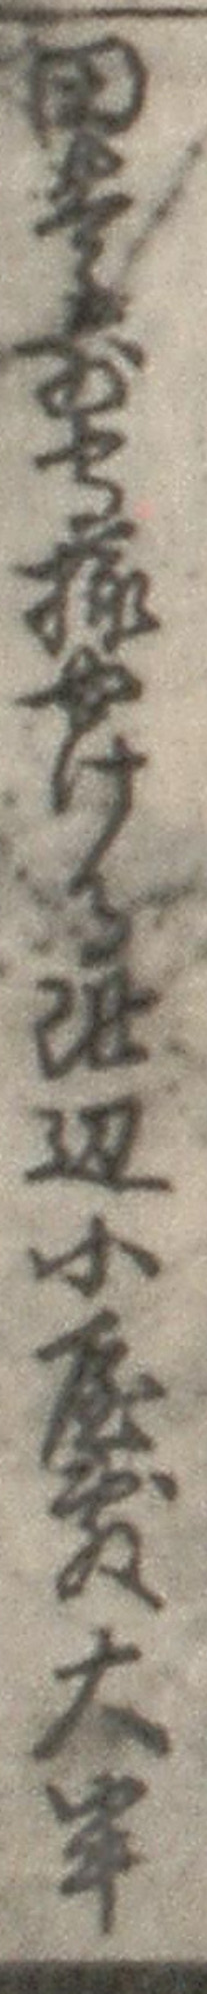田豊前守様やける此辺小屋敷大半
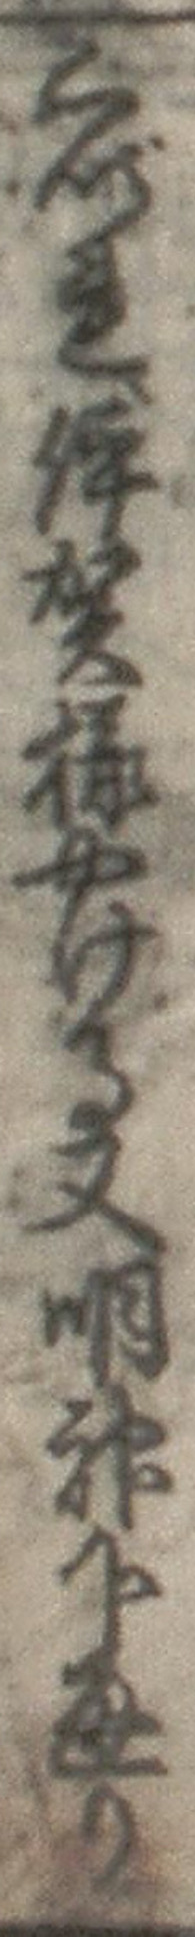くづれ伊賀様やける又明神下通り

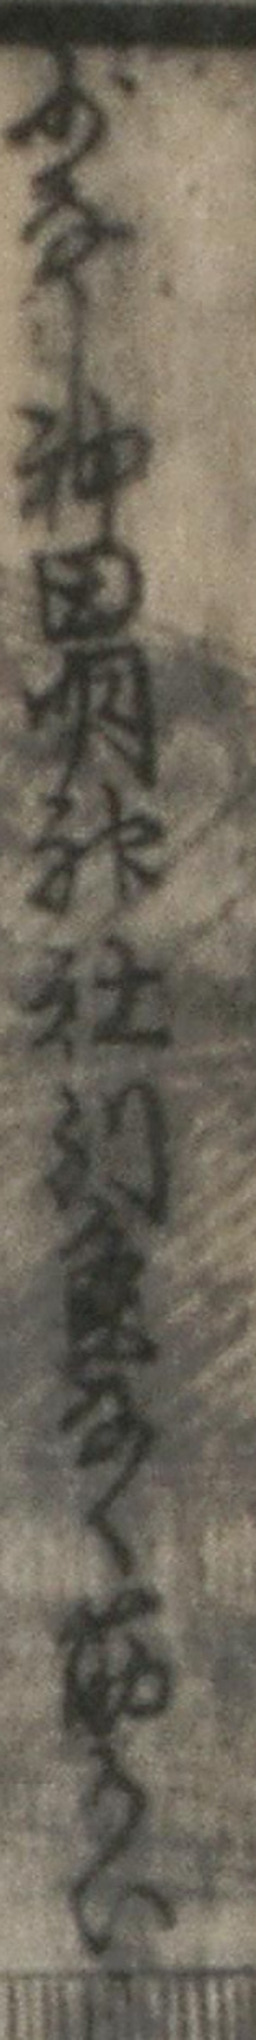少なし神田明神別条なく筋かい
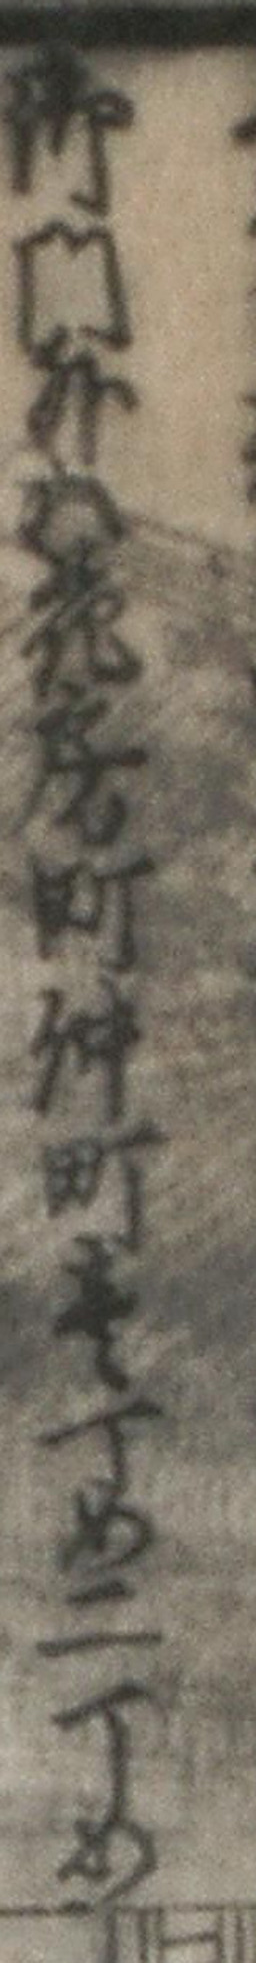御門外ハ花房町仲町壱丁め弐丁め
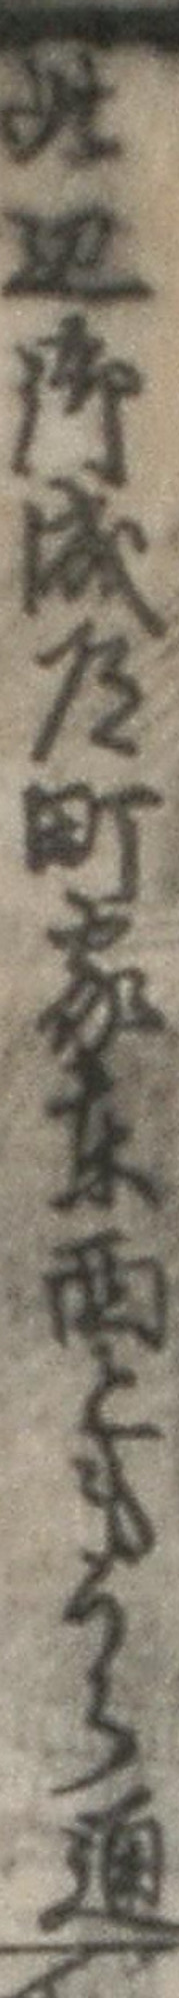此辺御成道町家東西ともうら通
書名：江戸大地震末代鑑
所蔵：東京大学地震研究所図書室 Earthquake Research Institute Library, The University of Tokyo, JAPAN
